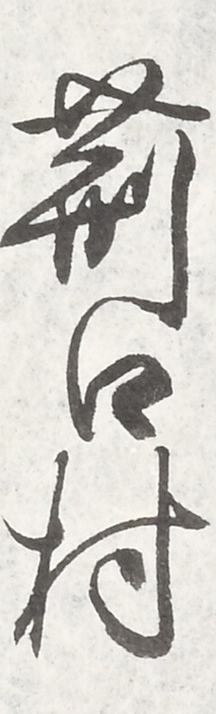荊口村
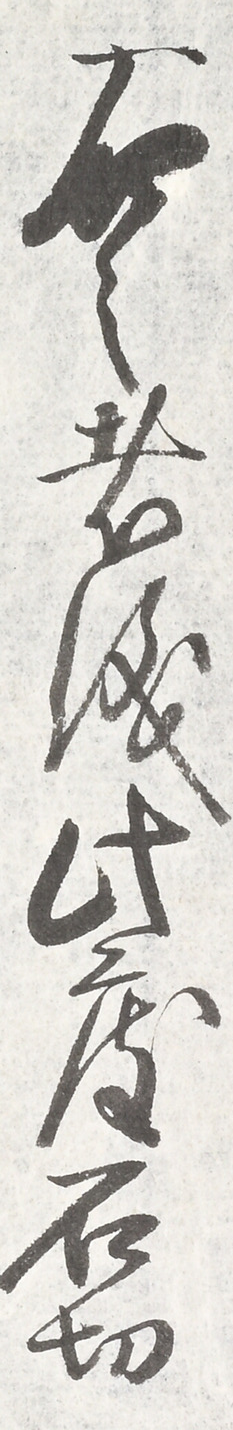右之者儀此度石切
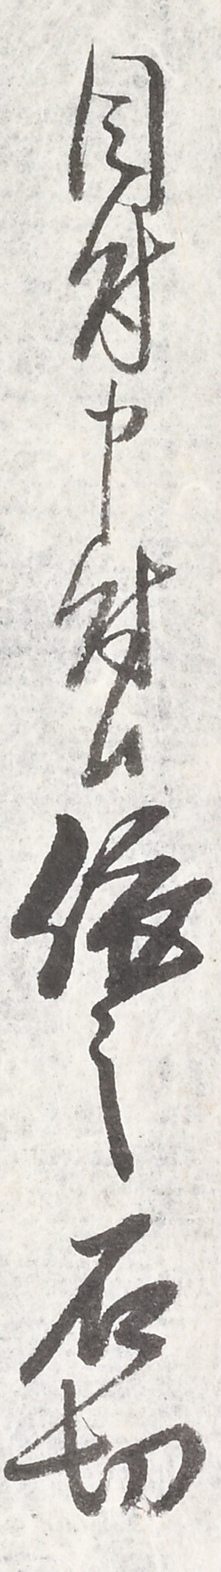目付申付候依之石切
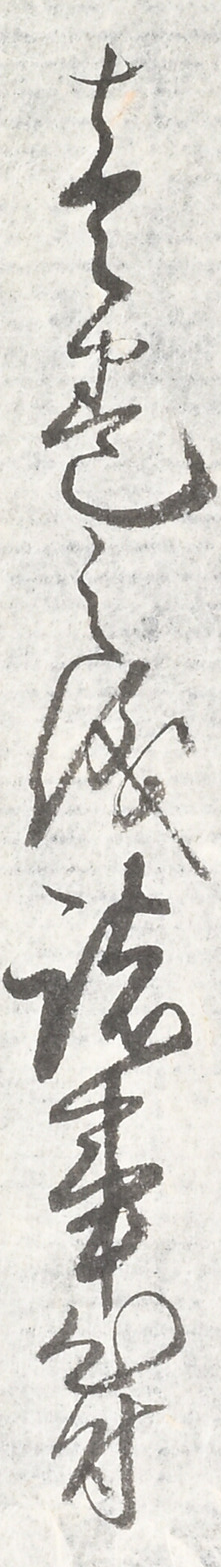壱巻之儀諸事心付
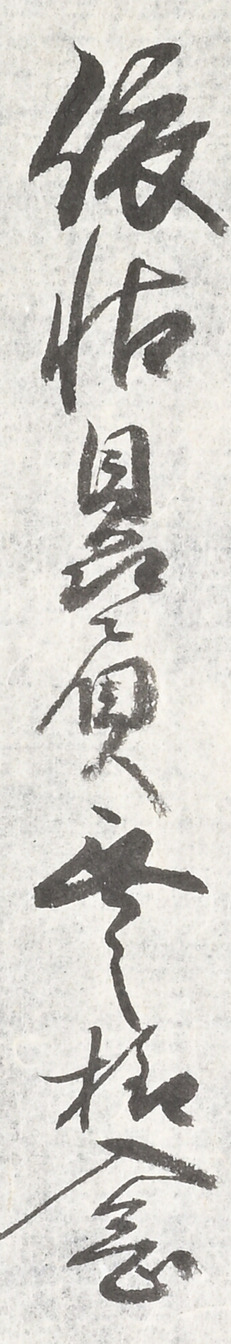依怙贔屓無之様入念
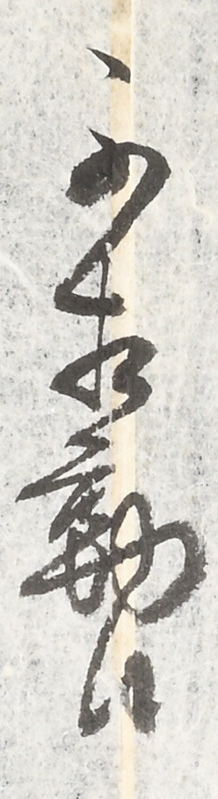可相勤候
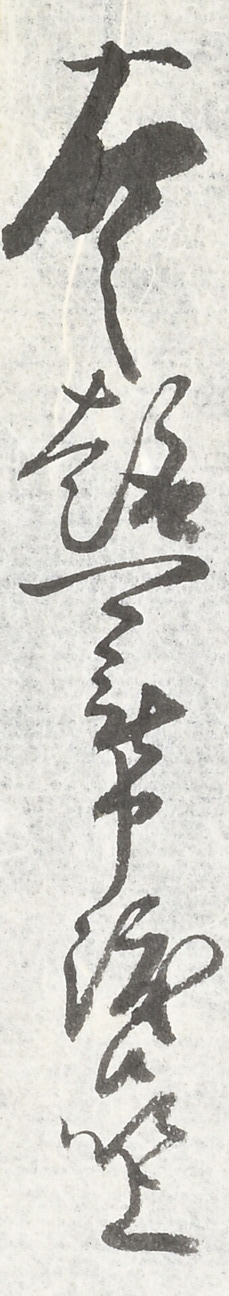右之趣可被申渡候以上
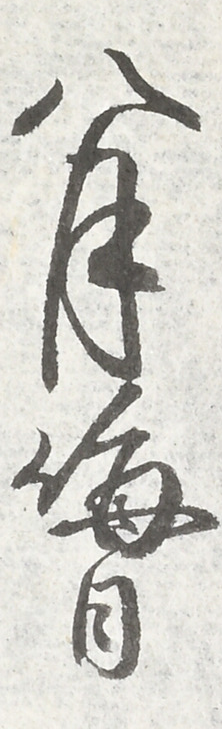八月晦日
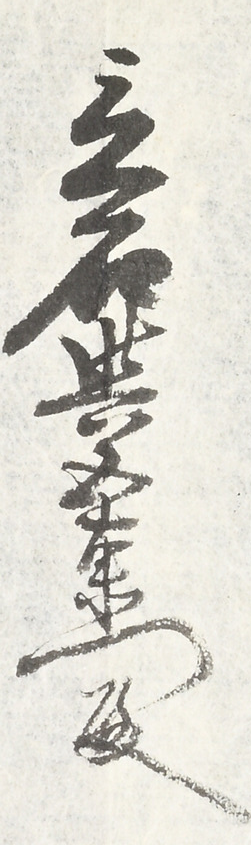立石与五右衛門殿
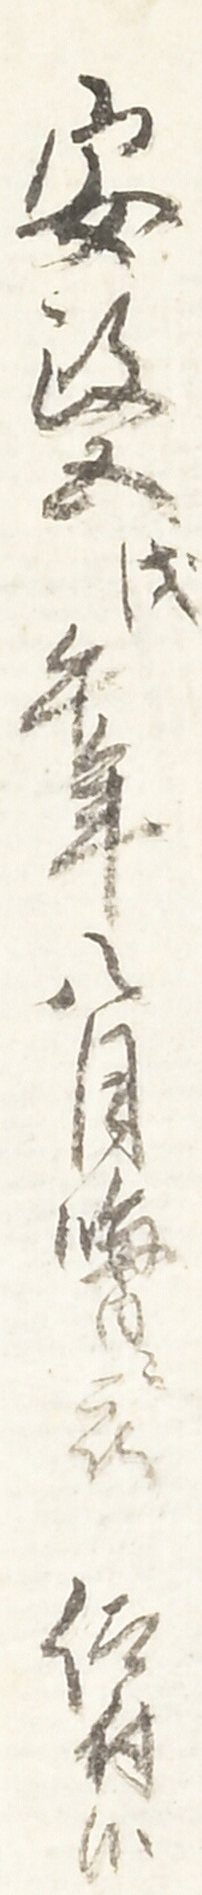安政五戊午年八月晦日ニ被仰付候
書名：（達）
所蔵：伊那市立高遠町図書館・合同会社AMANE
